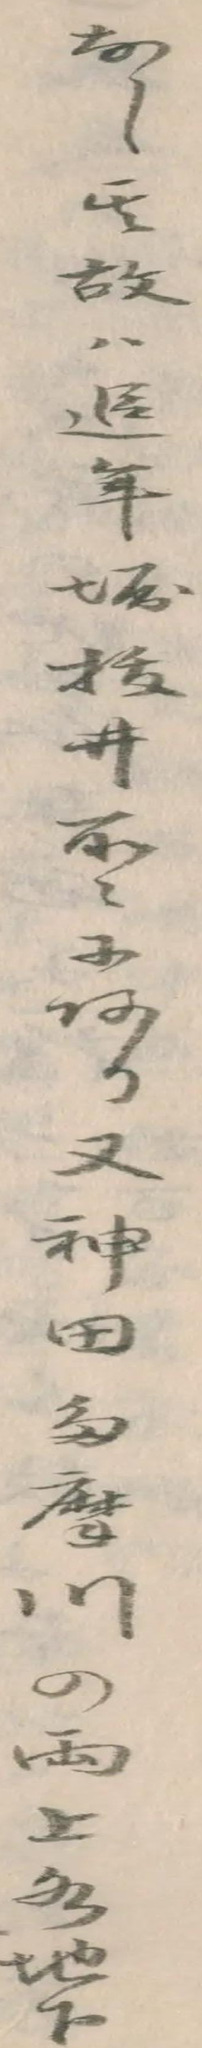なし其故は追年堀抜井所々にあり又神田多摩川の両上水地下
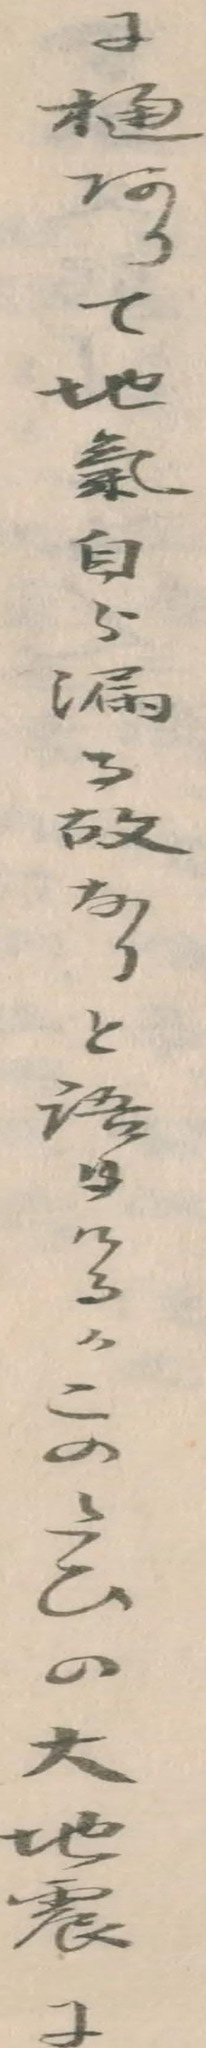に樋ありて地気自ら漏る故なりと語りけるかこのたひの大地震に
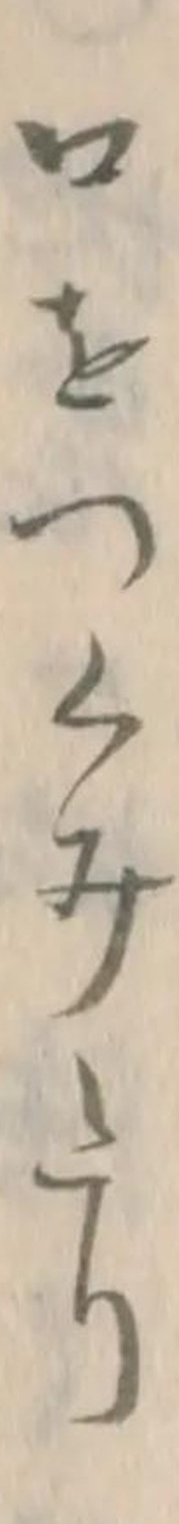口をつくみたり

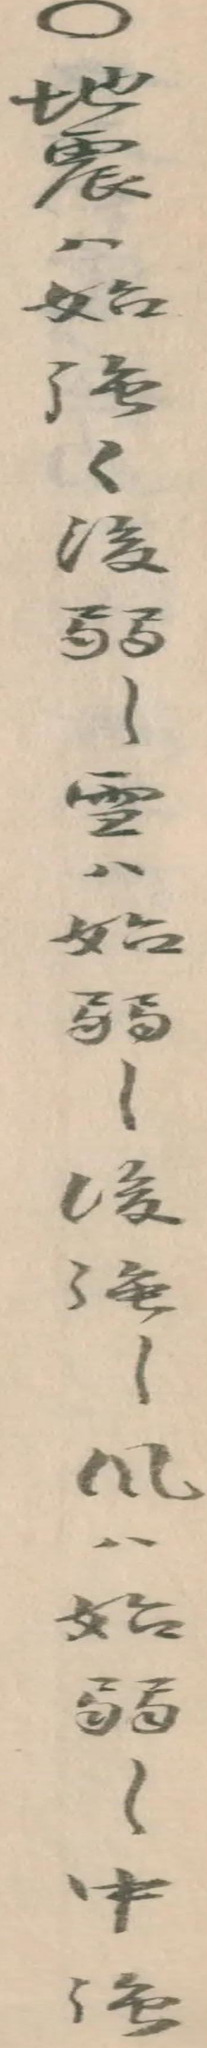〇地震は始強く後弱し雪は始弱し後強し風は始弱し中強
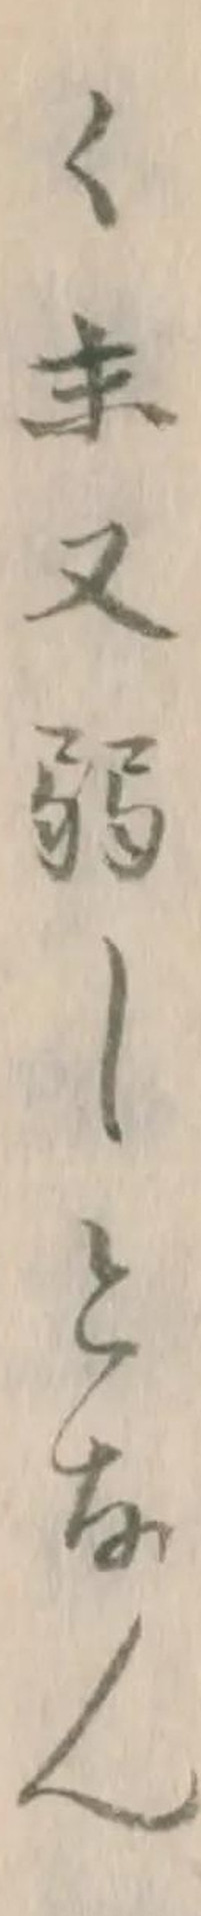く末又弱しとなん
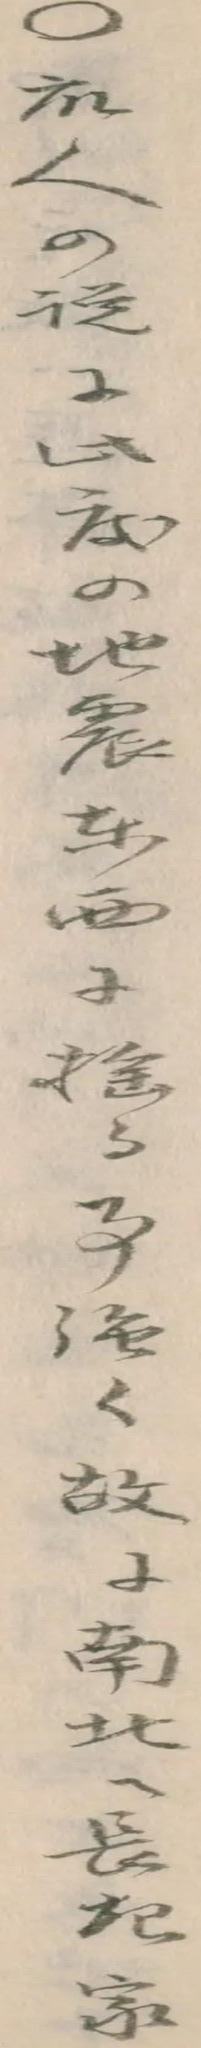〇衆人の説に此度の地震東西に揺る事強く故に南北へ長き家
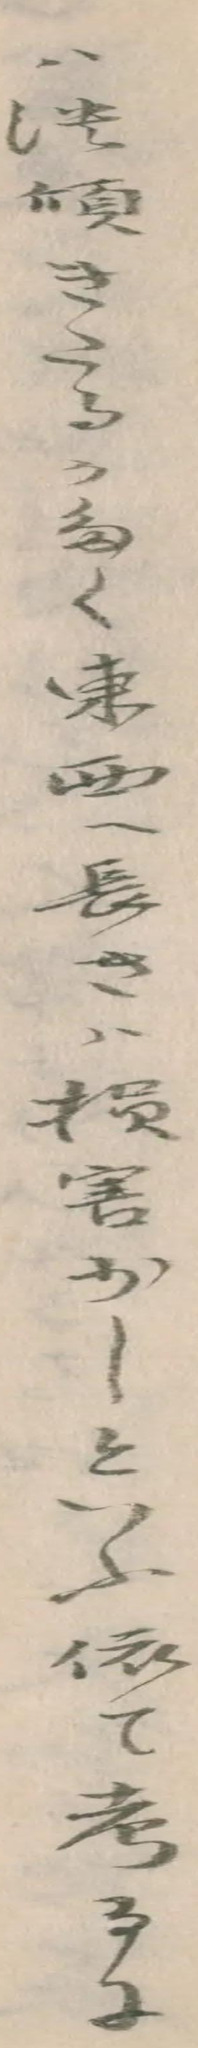は潰傾きたるか多くとうざ東西へ長きは損害少しといふ依て考るに
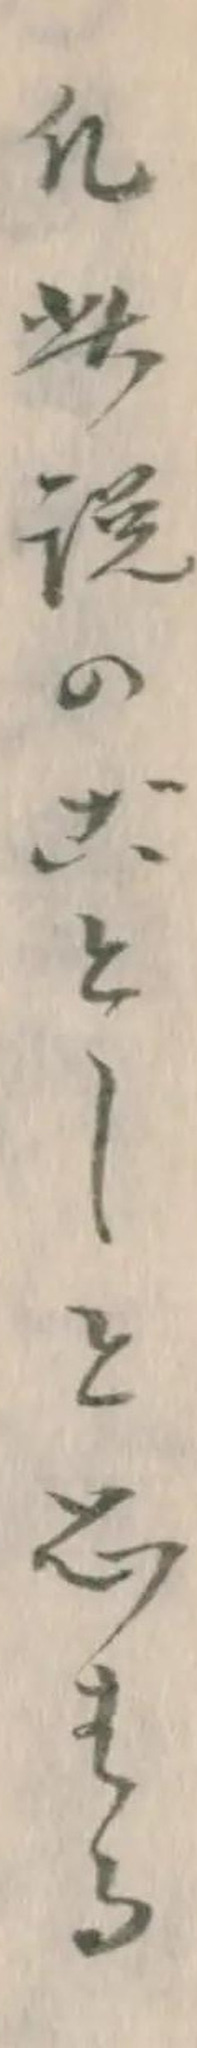凡此説のごとしと思はる
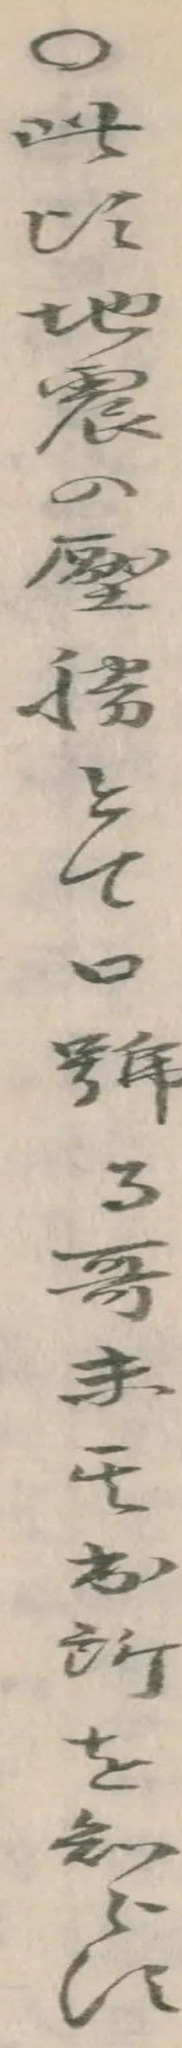〇此頃地震の圧勝とて口号る哥未其出所を知らす
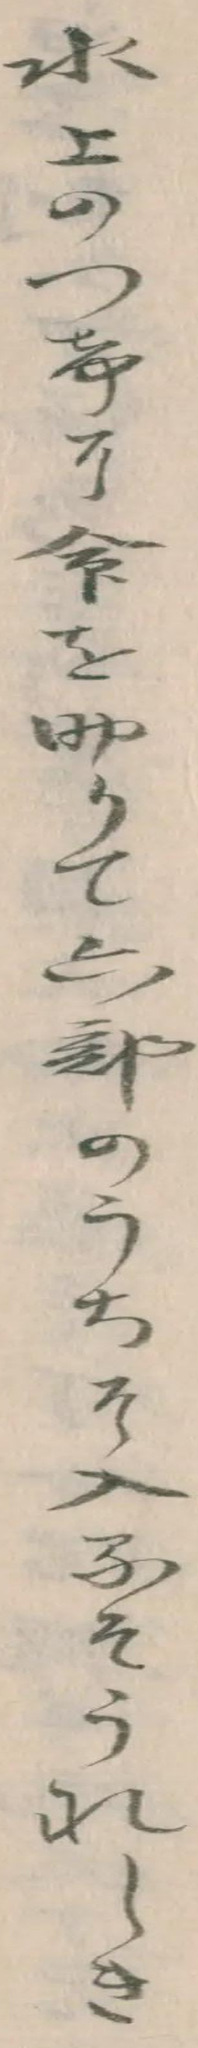水上のつけに命を助りて六部のうちに入るそうれしき
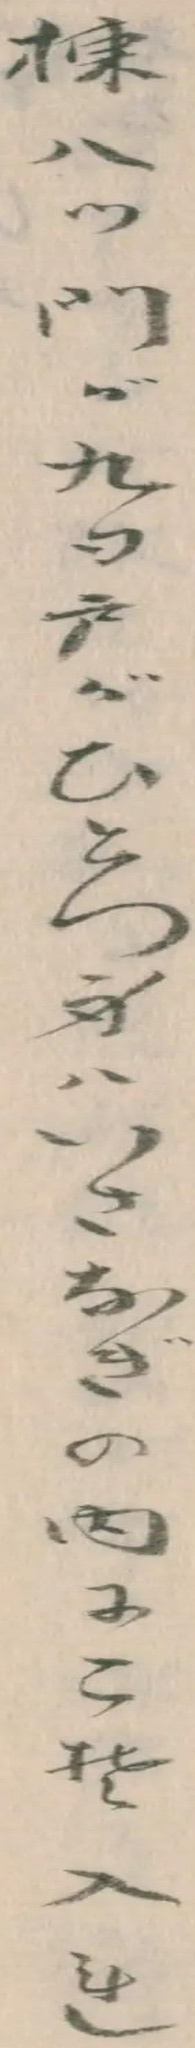棟八ツ門が九ツ戸がひとつ身はいさなぎの内にこそ入れ
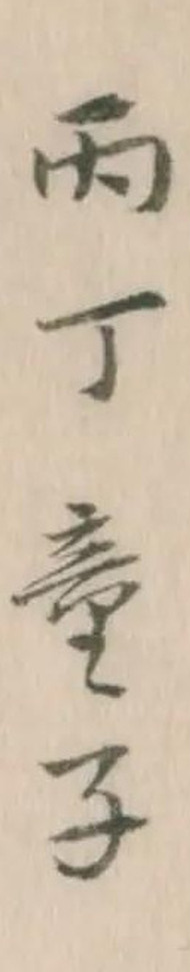丙丁童子

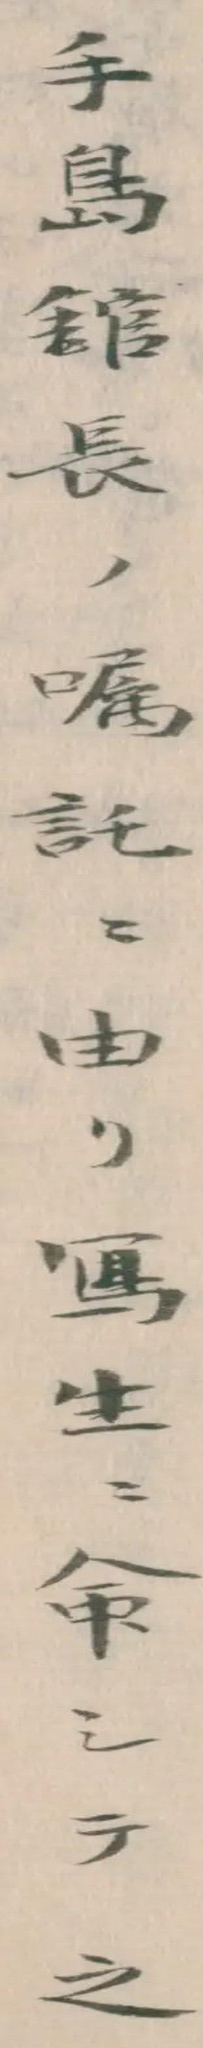手島舘長ノ嘱託ニ由リ写生ニ命シテ之
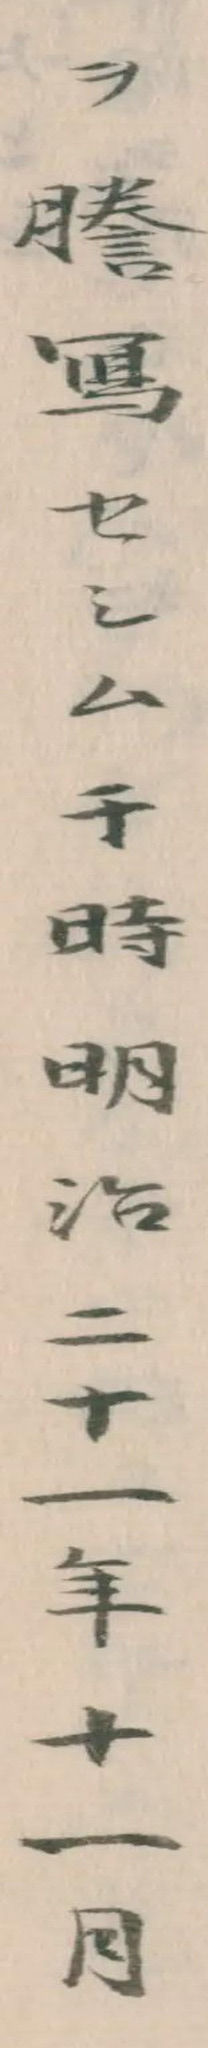ヲ謄写セシム于時明治二十一年十一月
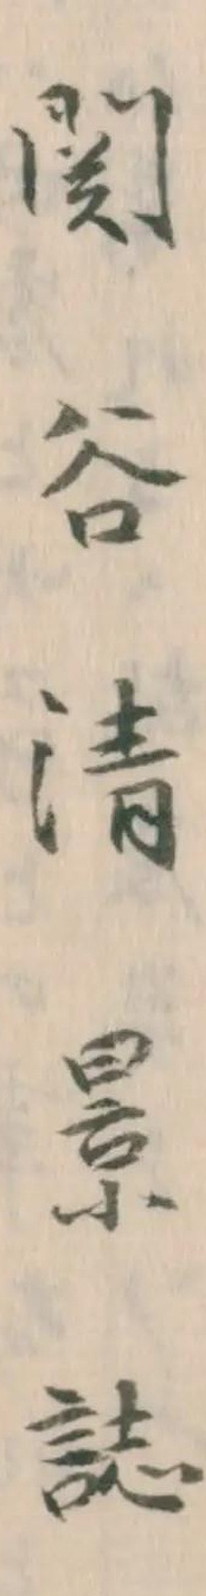関谷清景誌

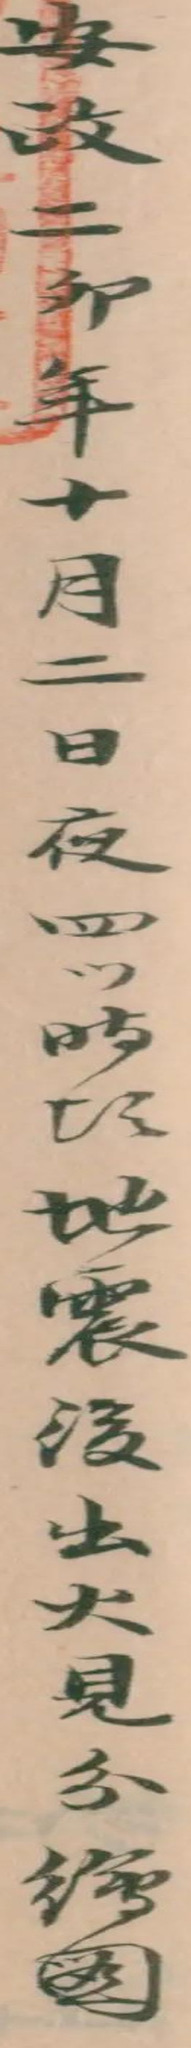安政二卯年十月二日夜四ツ時頃地震後出火見分絵図
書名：地災撮要. 巻7-9(地震之部)
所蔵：国立国会図書館 National Diet Library, JAPAN
